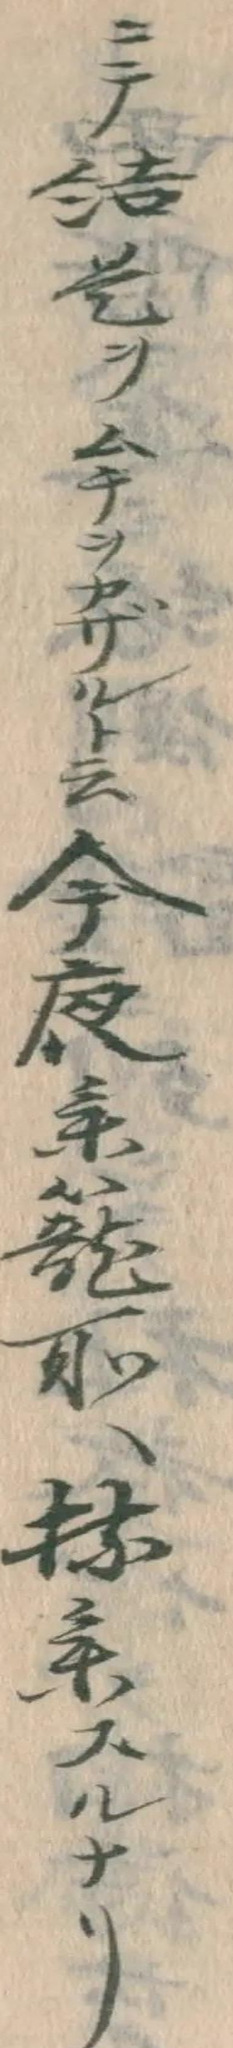ニテ結是ヲムチヲカザルト云今夜参籠所へ持参スルナリ
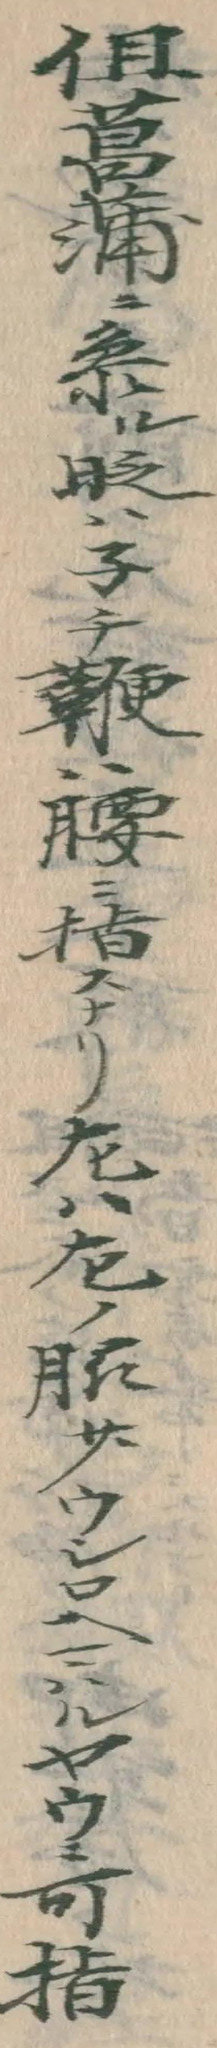但菖蒲ニ参ル時ハネチ鞭ハ腰ニ指スナリ左ハ左ノ脇少ウシロヘマハルヤウニ可指
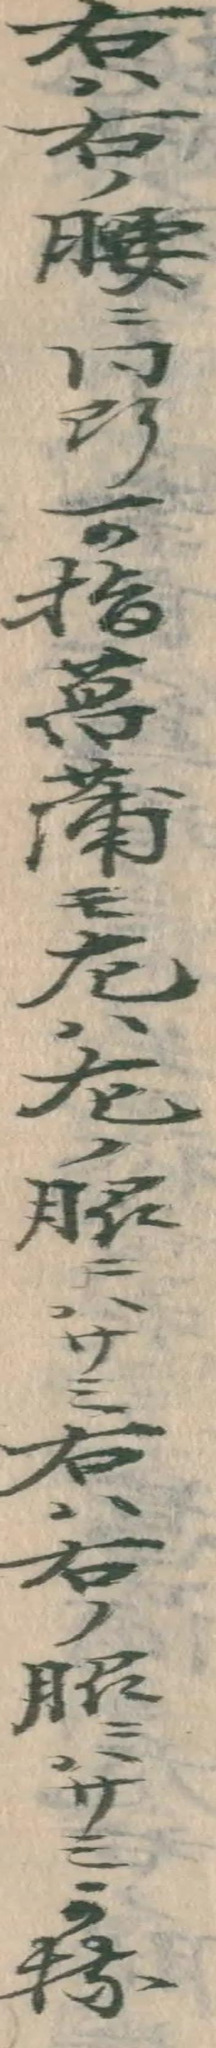右ハ右ノ腰ニ同断可指菖蒲モ左ハ左ノ脇ニハサミ右ハ右ノ脇ニハサミ可持
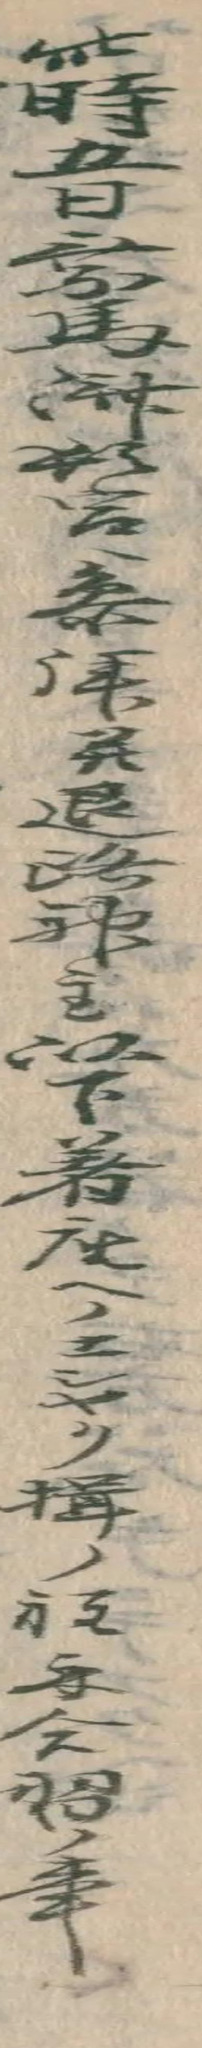此時五日乗馬済頓宮へ参拝并退路神主以下着座ヘノエシヤク揖ノ程示合習ノ事
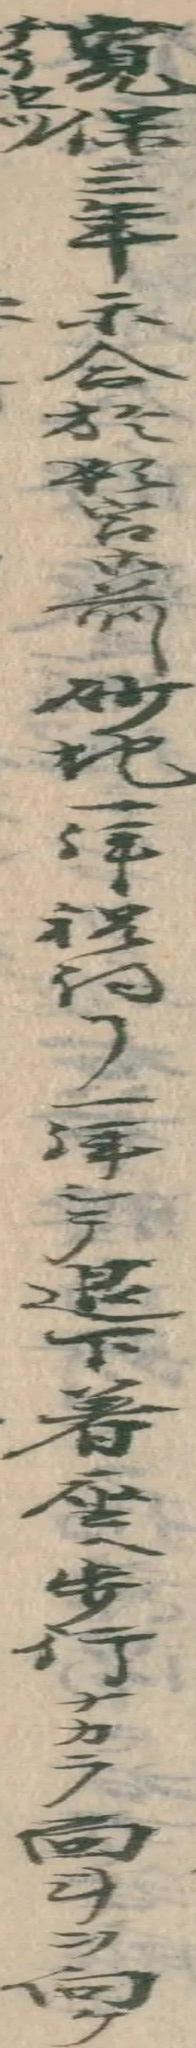寛保三年示合於頓宮御前砂地一拝祝詞了一拝シテ退下着座へ歩行ナカラ面計ヲ向ケ
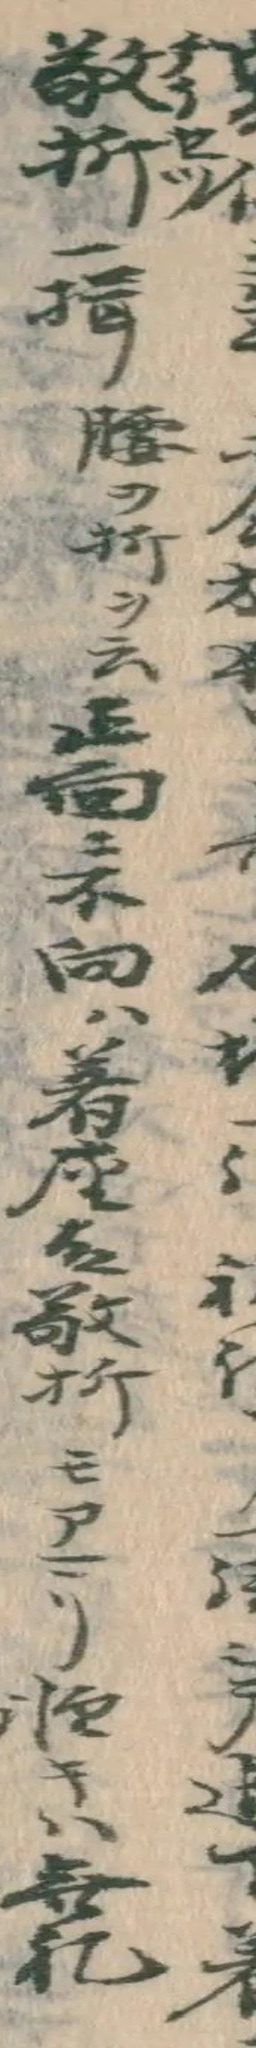敬折一揖膝ヲ折ヲ云正面ニ不向ハ着座故敬折モアマリ軽キハ無礼
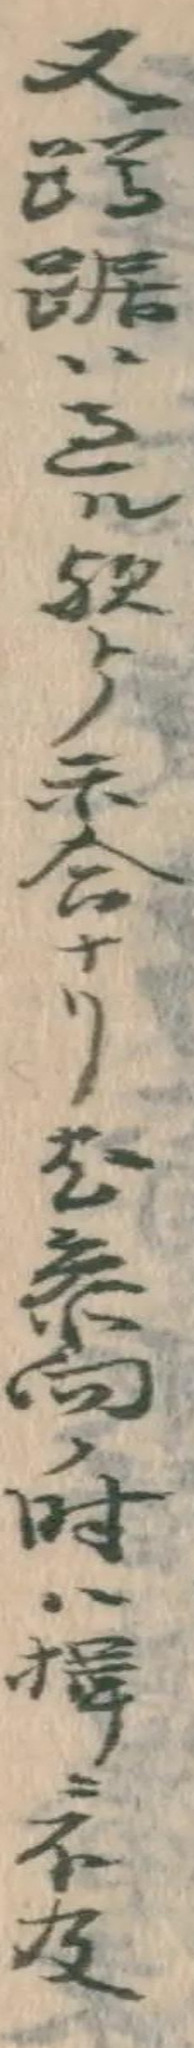又蹲踞ハ過ル歟トノ示合ナリ尤参向ノ時ハ揖ニ不及
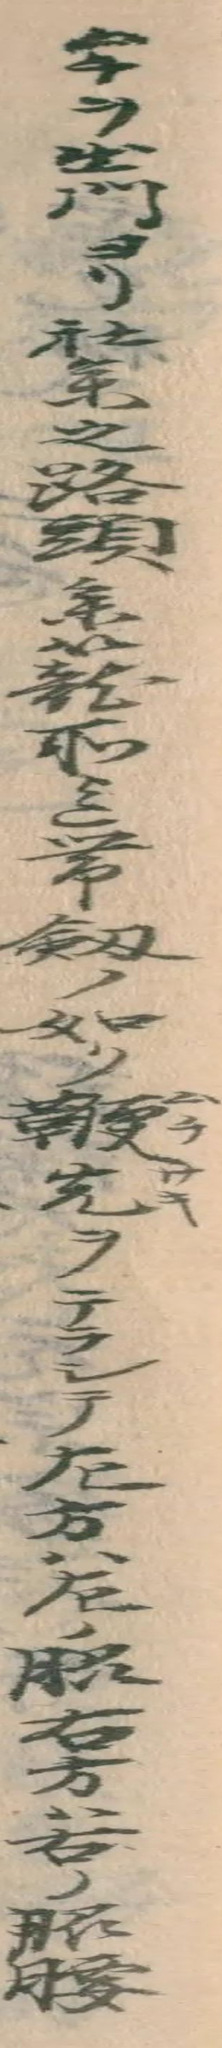ムチヲ出門ヨリ社参之路頭参籠所迄帯剱ノ如ク鞭先ヲテラシテ左方ハ左ノ脇右方ハ右ノ脇腰
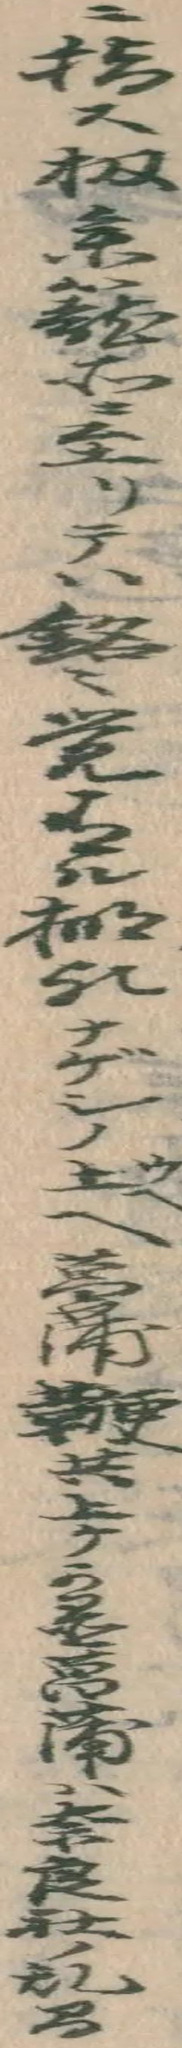ニ指ス扨参籠所ニ至リテハ銘々覚有ル棚歟ナゲシノ上へ菖蒲鞭共上ケ可置有菖蒲ハ奈良社ノ乱間
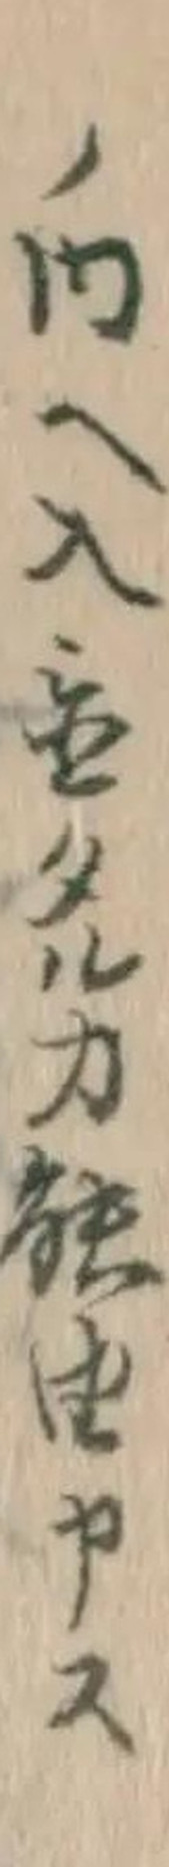ノ内ヘ入置タルカ能由申ス
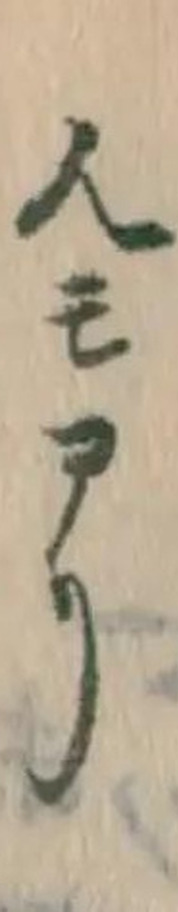人モアリ
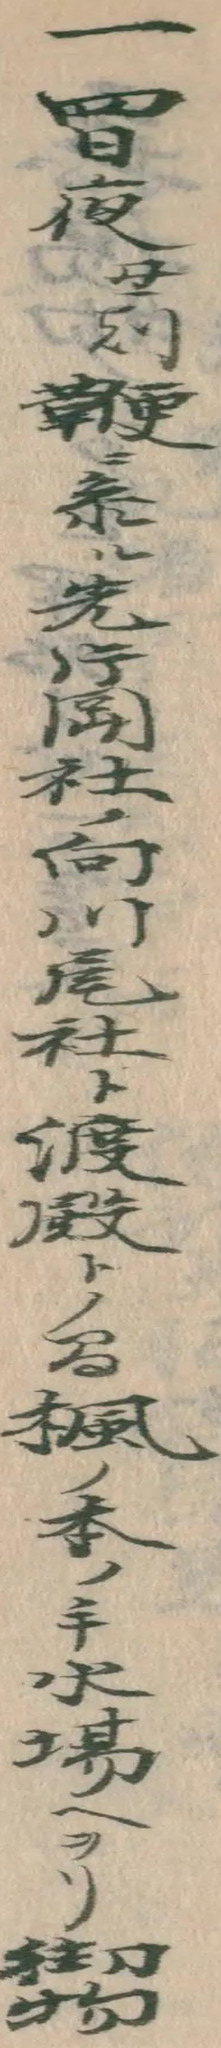一四日夜丑刻鞭ニ来参ル先片岡社ノ向川尾社ト渡殿トノ間楓ノ本ノ手水場ヘヲリ御物
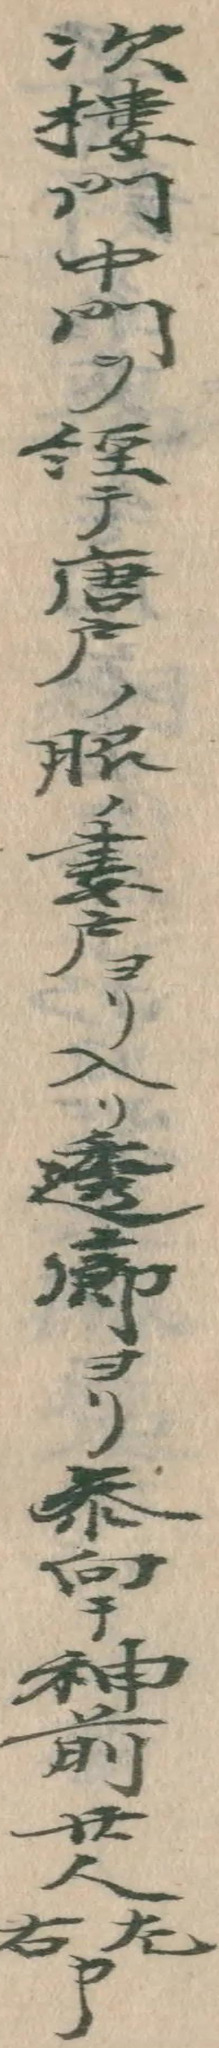次楼門中門ヲ経テ唐戸ノ脇ノ妻戸ヨリ入リ透廊ヨリ参向于神前廿人左右申
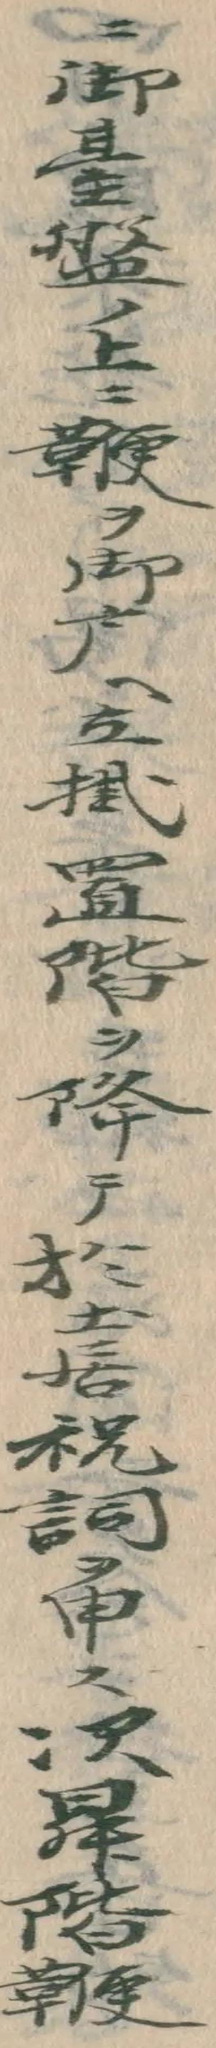ニ御台盤ノ上ニ鞭ヲ御戸へ立掛置階ヲ降テ於土居祝詞ヲ申ス次昇階鞭
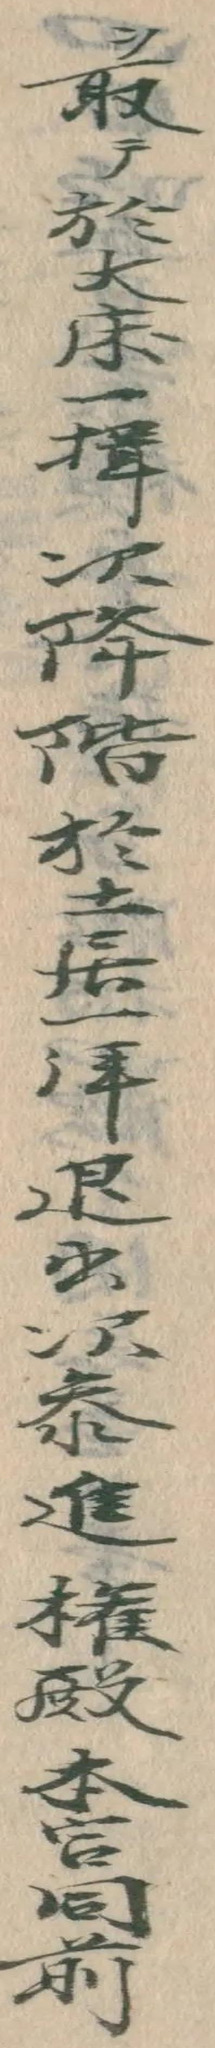ヲ取テ於大床一揖次降階於土居一拝退出次参進権殿本宮同前
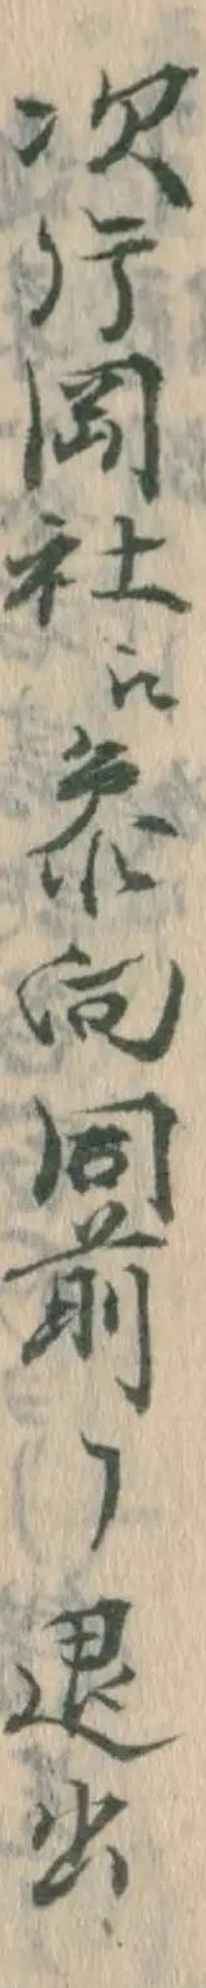次片岡社江参向同前了退出
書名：賀茂社記録. 第11冊
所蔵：国立国会図書館 National Diet Library, JAPAN
